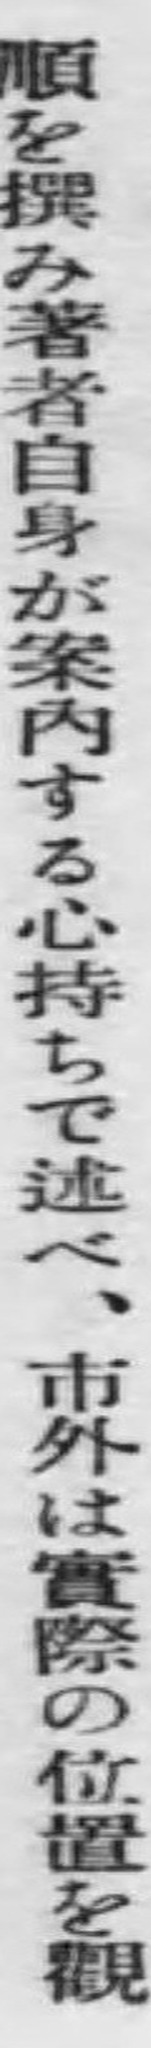順を撰み著者自身が案内する心持ちで述べ、市外は實際の位置を観
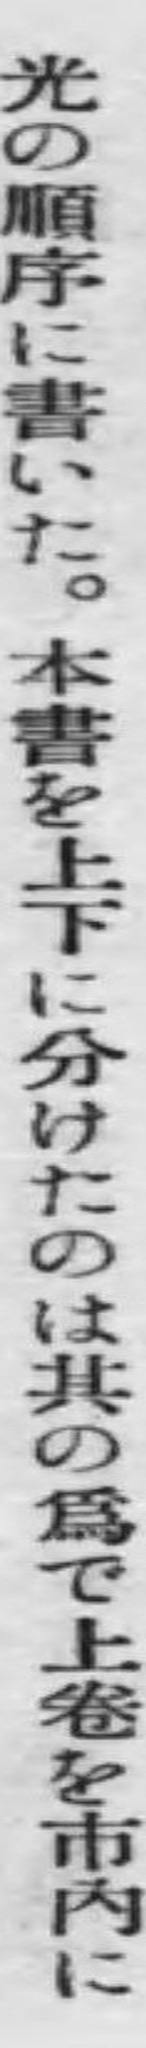光の順序に書いた。本書を上下に分けたのは其の為で上巻を市内に
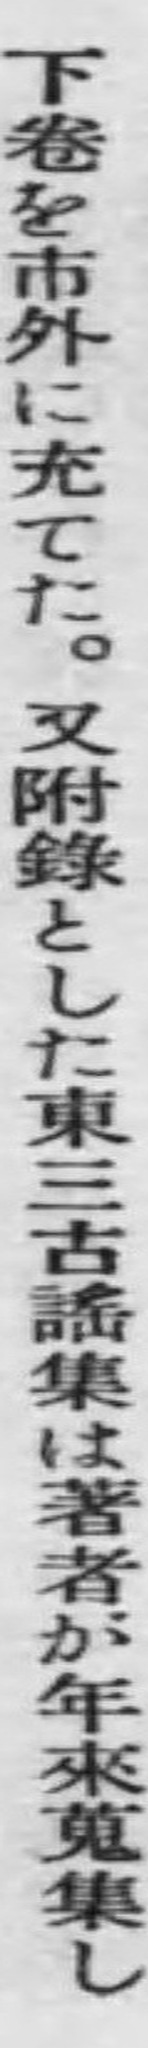下巻を市外に充てた。又附録とした東三古謡集は著者が年來蒐集し
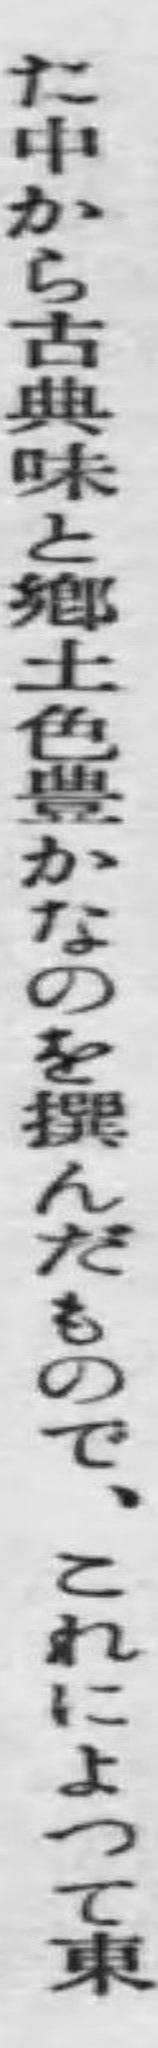た中から古典味と郷土色豊かなのを撰んだもので、これによつて東
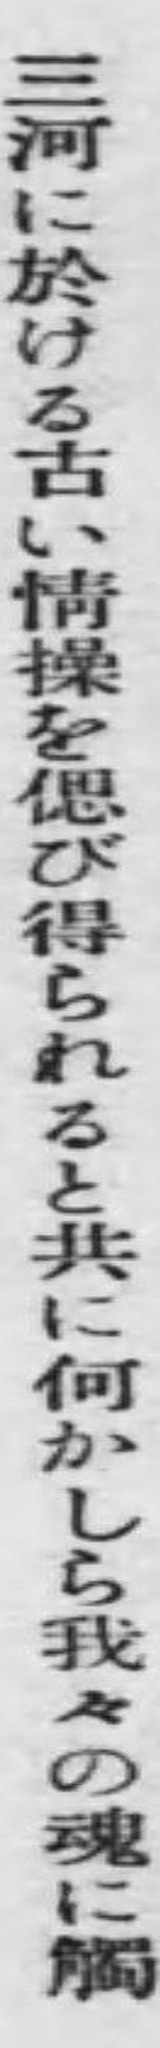三河に於ける古い情操を偲び得られると共に何かしら我々の魂に触
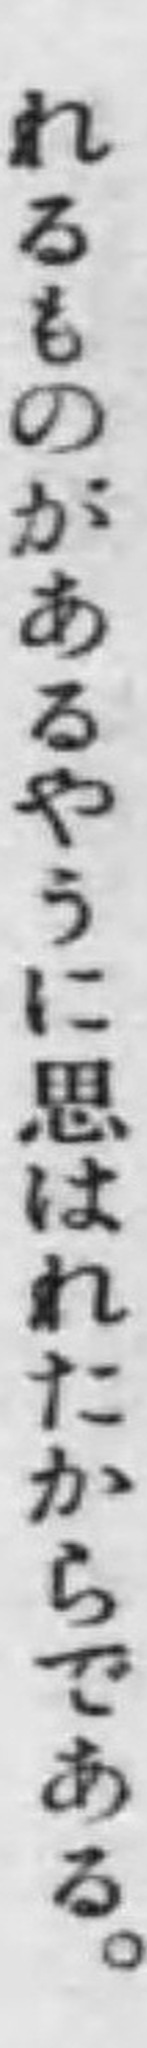れるものがあるやうに思はれたからである。
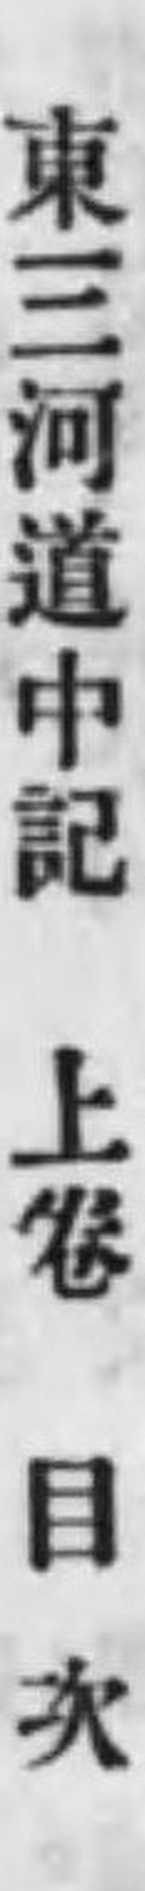東三河道中記上巻目次
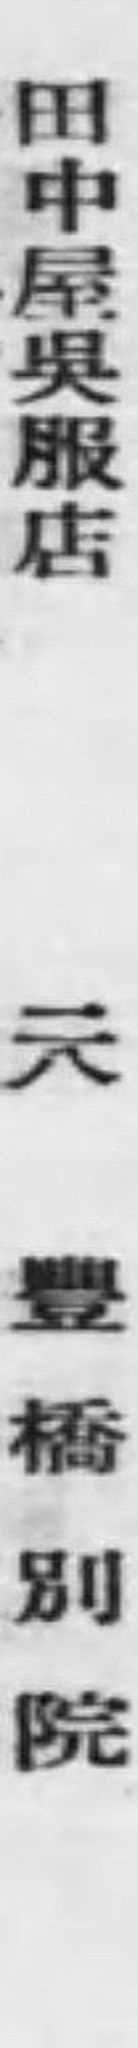田中屋呉服店二八豊橋別院二九
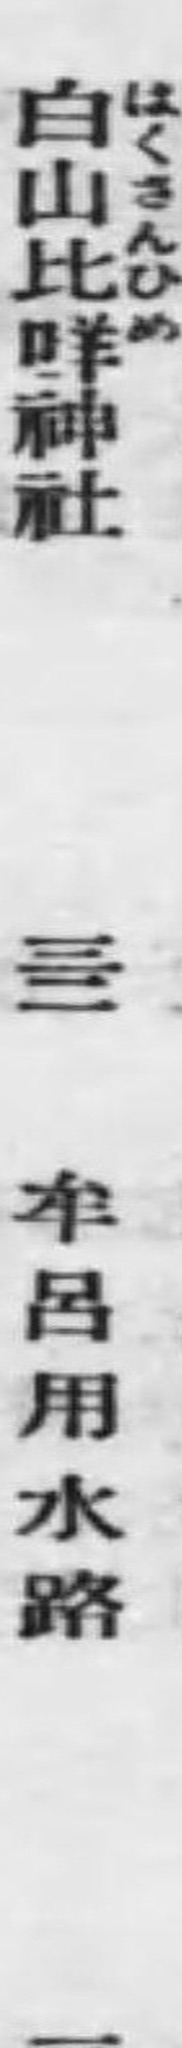白山比咩神社三二牟呂用水路三三
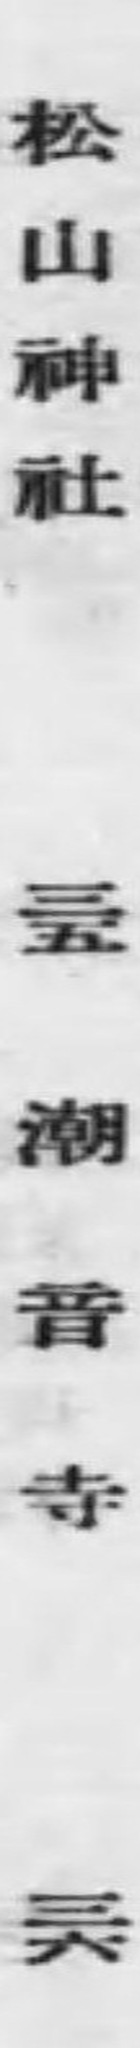松山神社三五潮音寺三六
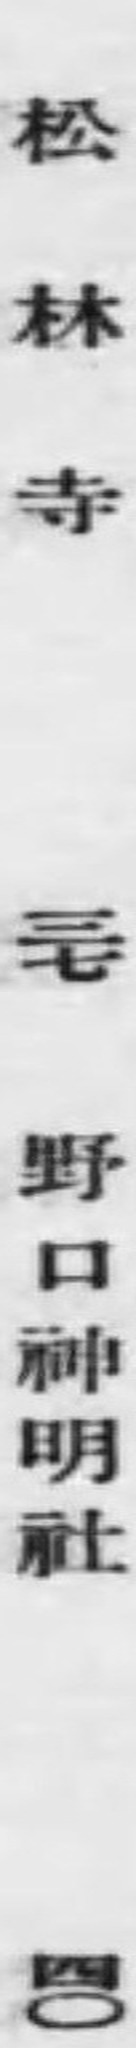松林寺三七野口神明社四〇

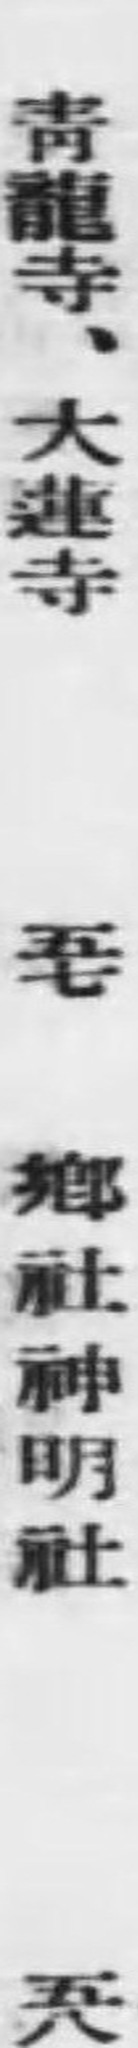青龍寺、大蓮寺五七郷社神明社五八
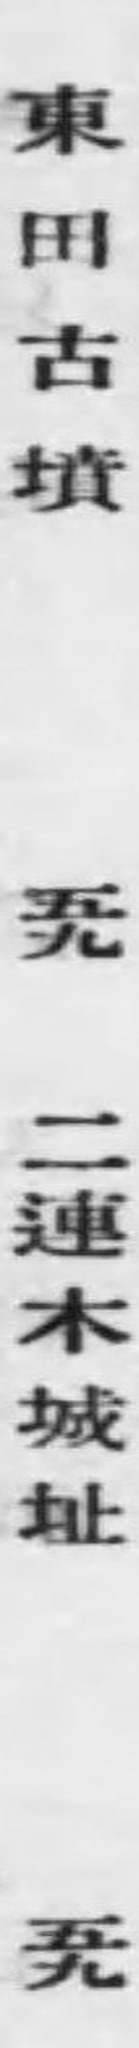東田古墳五九二連木城址五九
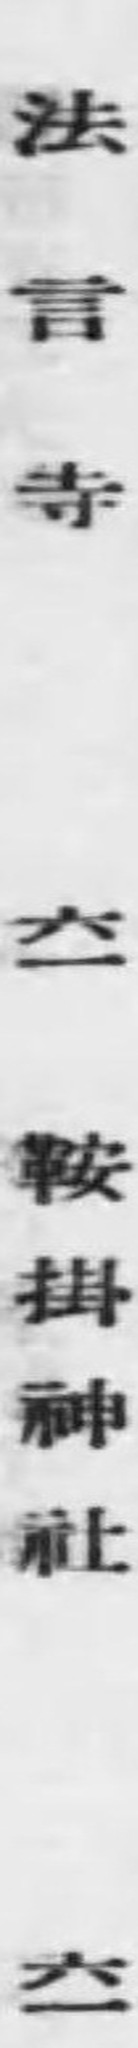法言寺六一鞍掛神社六一
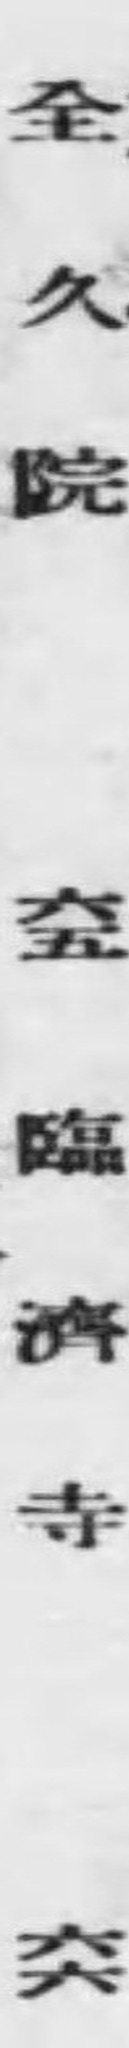全久院六五臨済寺六六
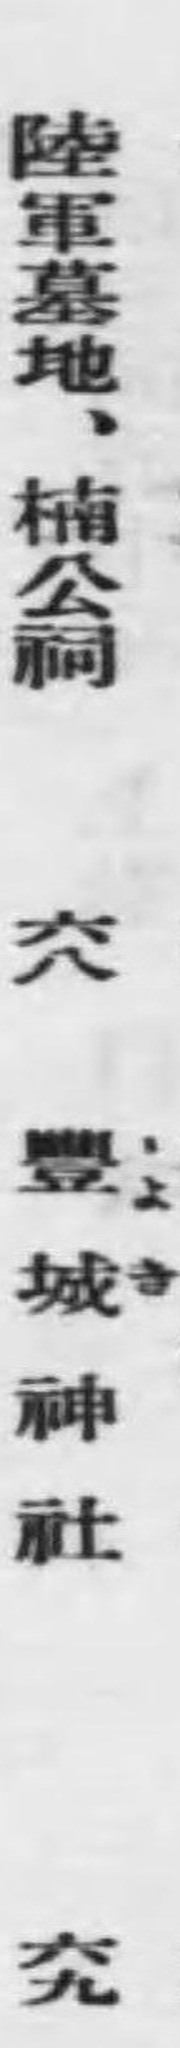陸軍墓地、楠公祠六八豊城神社六九
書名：東三河道中記 : 豊橋市及其附近案内
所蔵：国立国会図書館 National Diet Library, JAPAN
